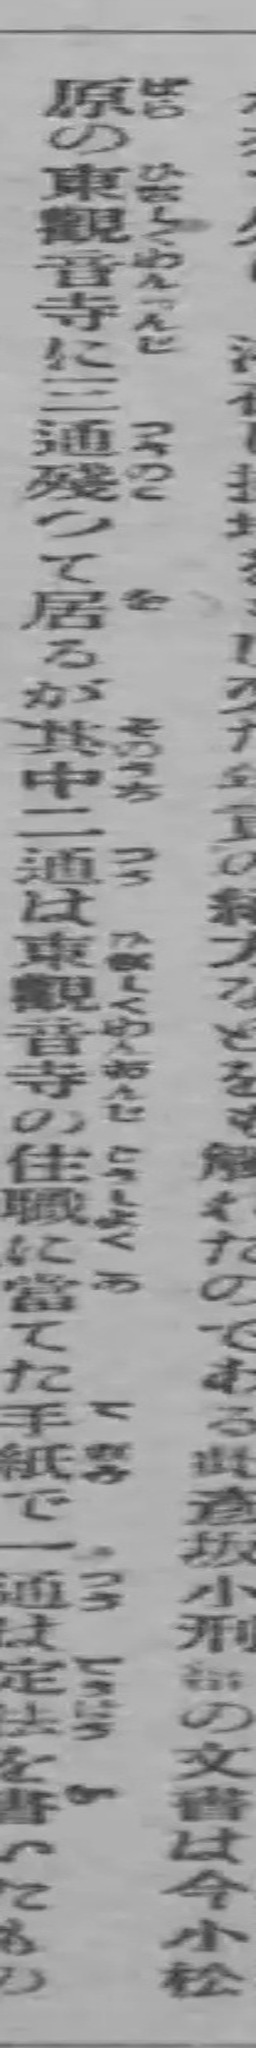原の東観音寺に三通残つて居るが其中二通は東観音寺の住職に当てた手紙で一通は定法を書いたもの
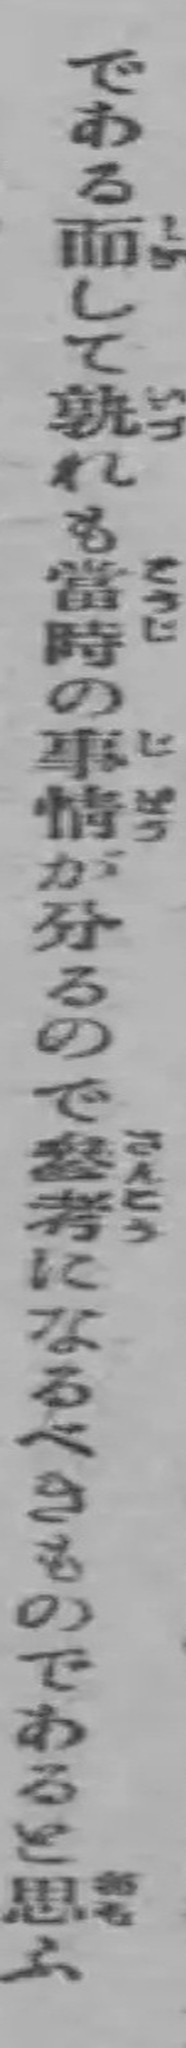である而して孰れも当時の事情が分るので参考になるべきものであると思ふ
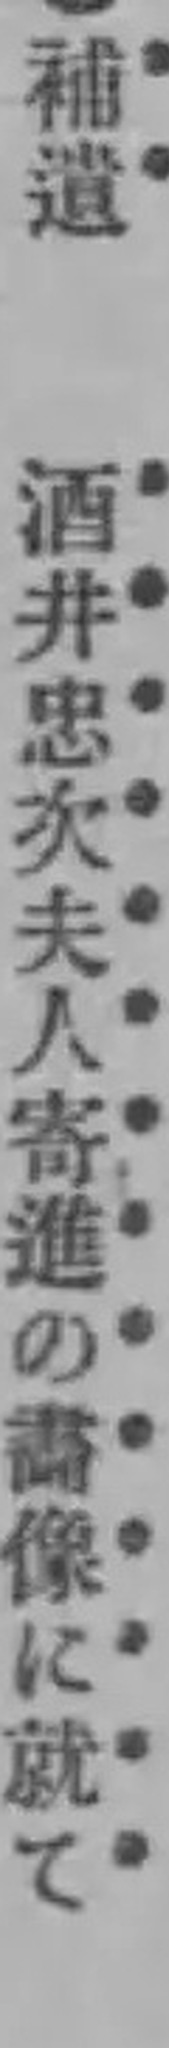●補遺酒井忠次夫人寄進の画像に就て
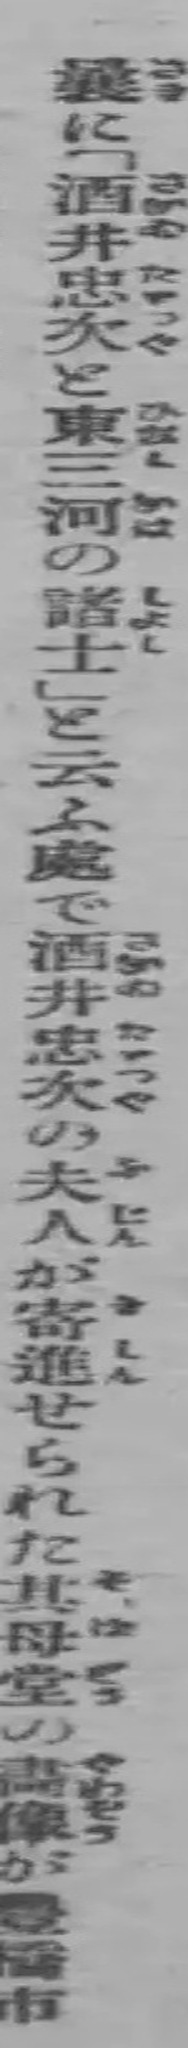曩に「酒井忠次と東三河の諸士」と云ふ処で酒井忠次の夫人が寄進せられた其母堂の画像が豊橋市
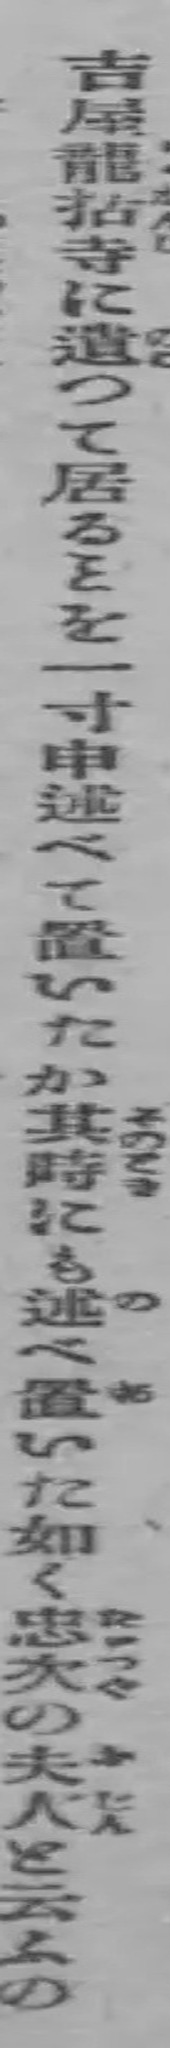吉屋龍拈寺に遺つて居ることを一寸申述べて置いたか其時にも述べ置いた如く忠次の夫人と云ふの
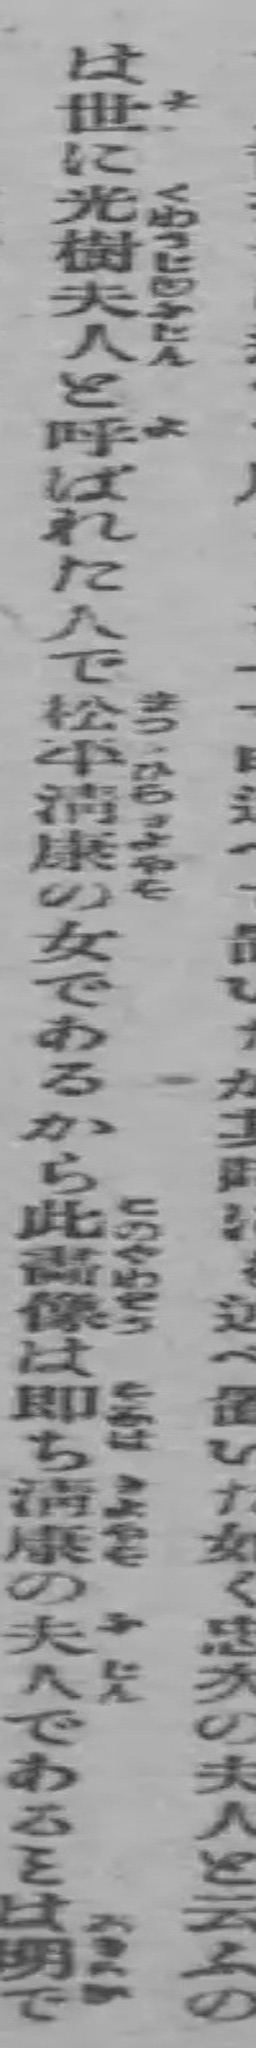は世に光樹夫人と呼ばれた人で松平清康の女であるから此画像は即ち清康の夫人であることは明で
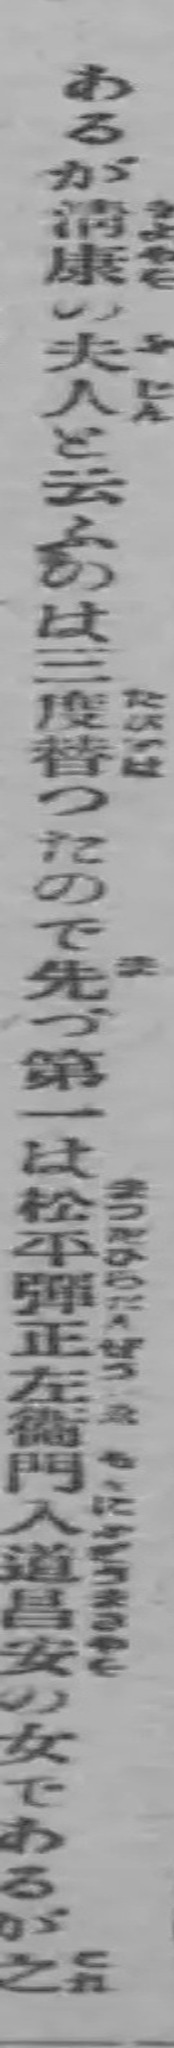あるが清康の夫人と云ふのは三度替つたので先づ第一は松平弾正左衛門入道昌安の女であるが之
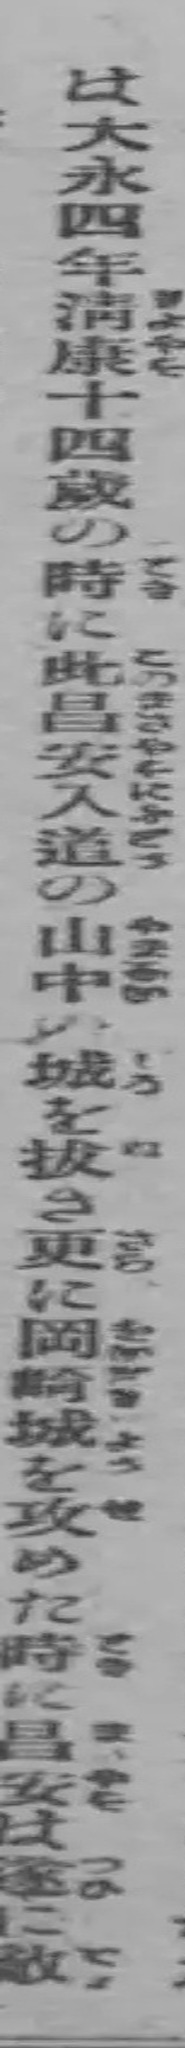は大永四年清康十四歳の時に此昌安入道の山中の城を抜き更に岡崎城を攻めた時に昌安は遂に敵
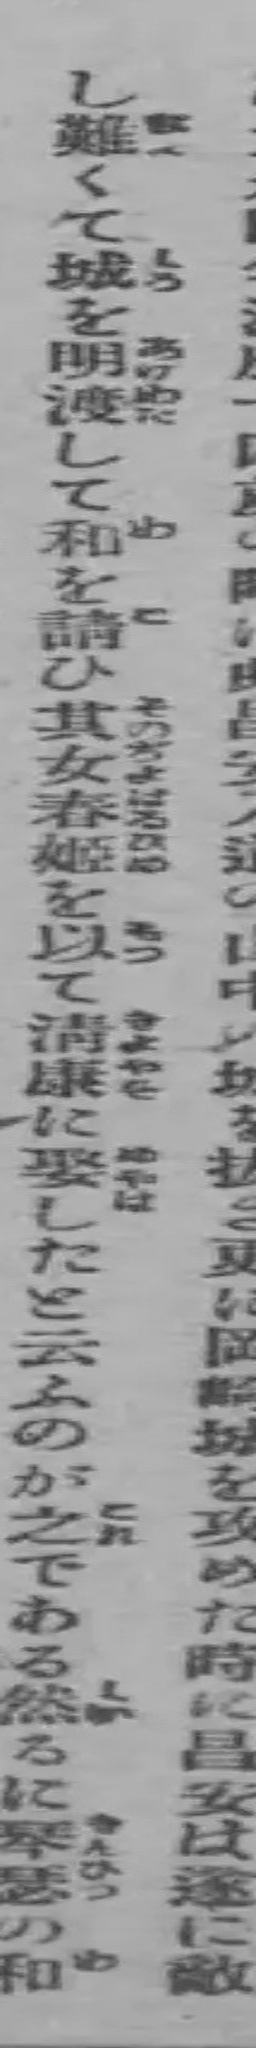し難くて城を明渡して和を請ひ其女春姫を以て清康に娶したと云ふのが之である然るに琴瑟の和
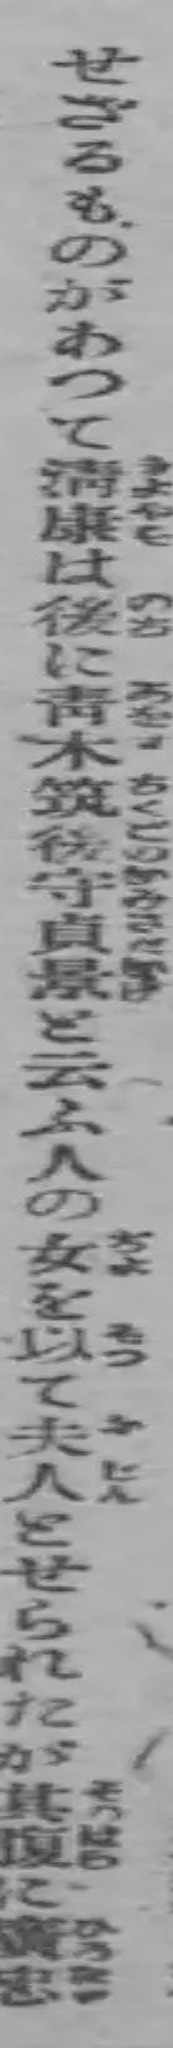せざるものがあつて清康は後に青木筑後守貞景と云ふ人の女を以て夫人とせられたが其腹に広忠
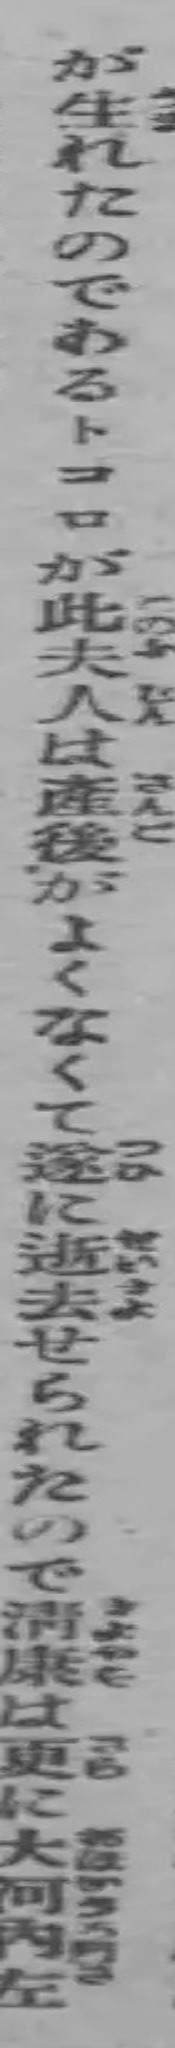が生れたのであるトコロが此夫人は産後がよくなくて遂に逝去せられたので清康は更に大河内左
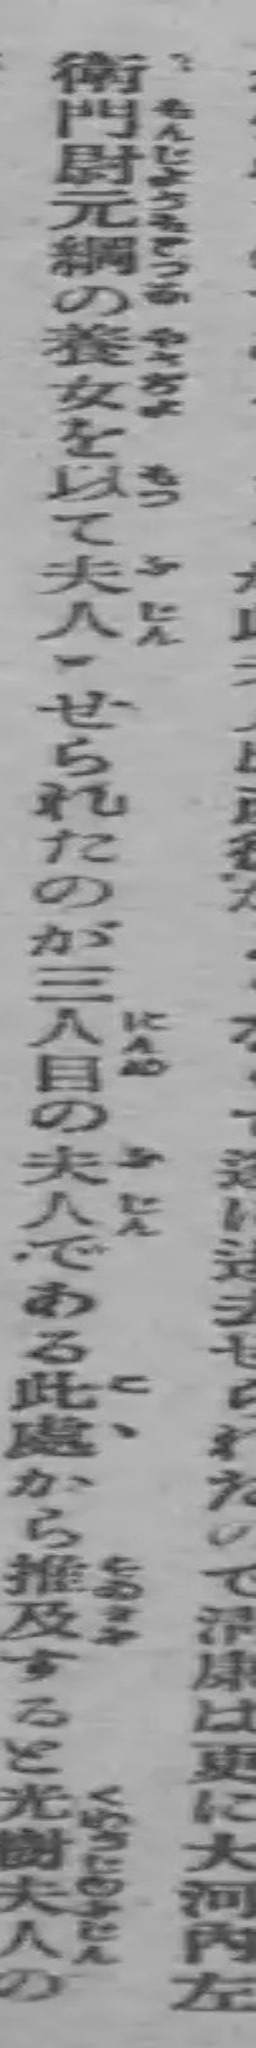衛門尉元網の養女を以て夫人とせられたのが三人目の夫人である此処から推及すると光樹夫人の
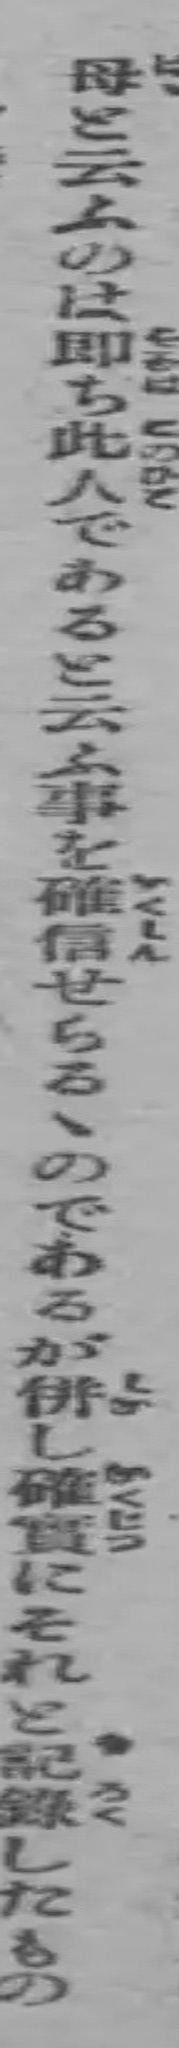母と云ふのは即ち此人であると云ふ事を確信せらるゝのであるが併し確実にそれと記録したもの
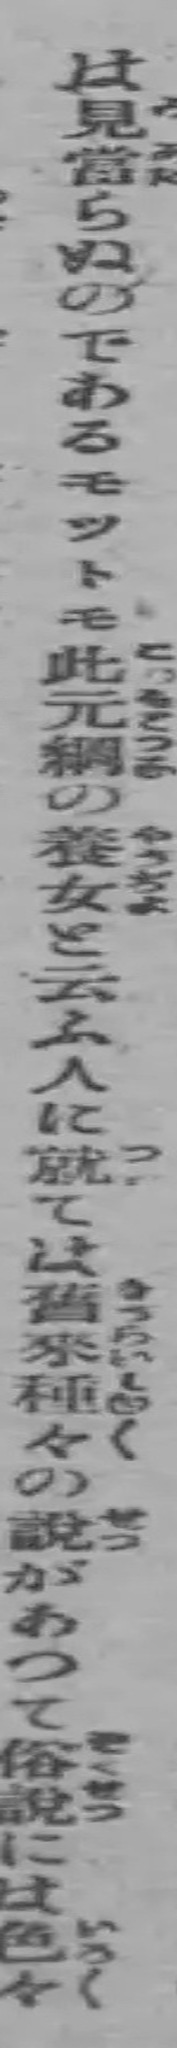は見当らぬのであるモツトモ此元網の養女と云ふ人に就ては旧来種々の説があつて俗説には色々
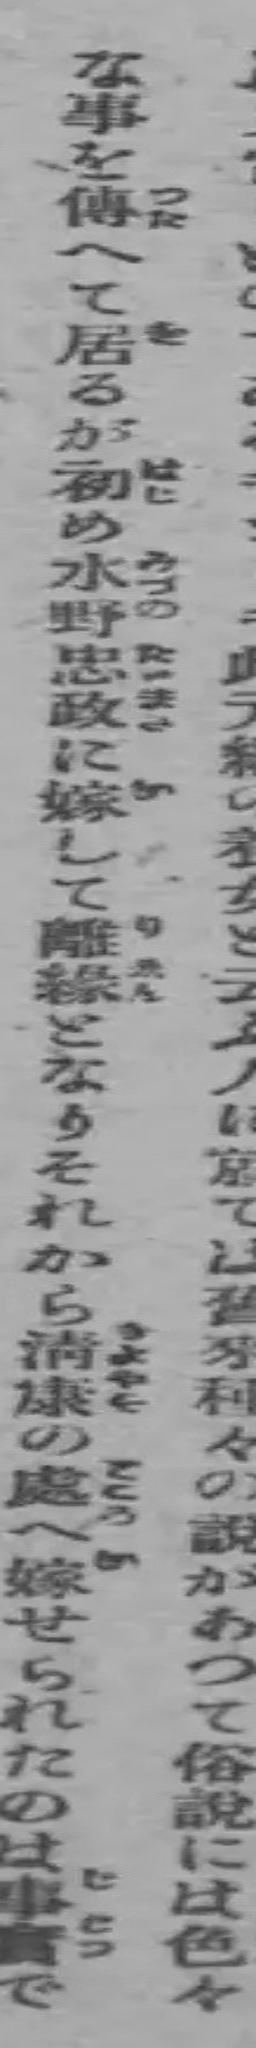な事を伝へて居るが初め水野忠政に嫁して離縁となりそれから清康の処へ嫁せられたのは事実で
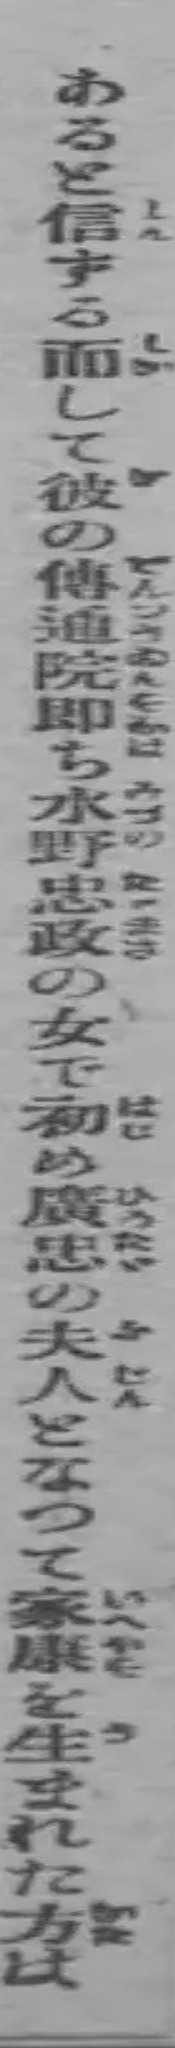あると信ずる而して彼の伝通院即ち水野忠政の女で初め広忠の夫人となつて家康を生まれた方は
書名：豊橋市史談
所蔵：国立国会図書館 National Diet Library, JAPAN
